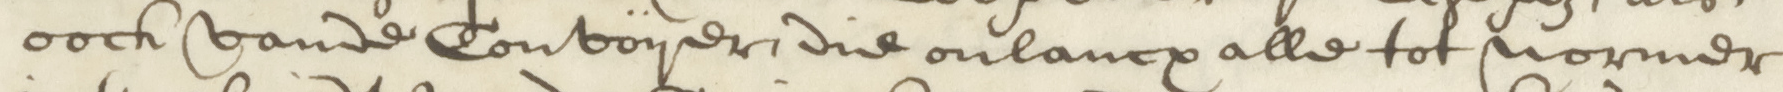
oock vande Convoijer, die onlancx alle tot normer
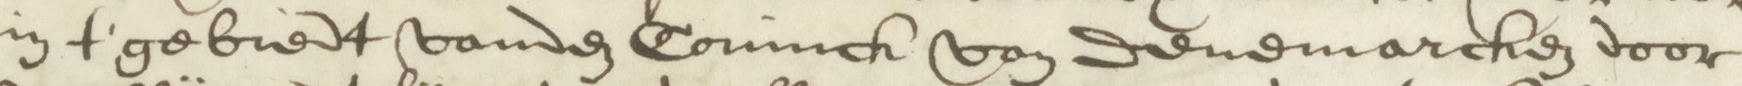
in t‛ gebiedt vanden Coninck van Denemarcken door
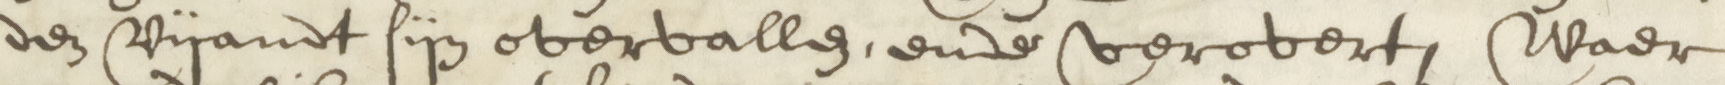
den Vijandt sijn overvallen, ende verovert. Waer
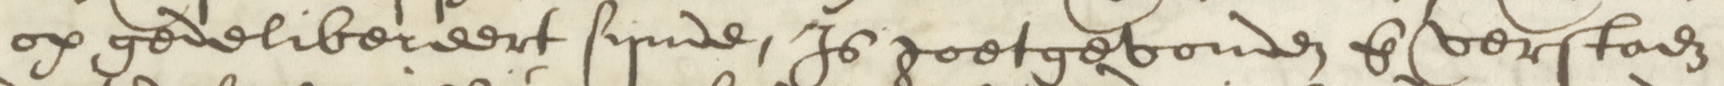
op gedelibereert sijnde, Is goetgevonden & verstaen
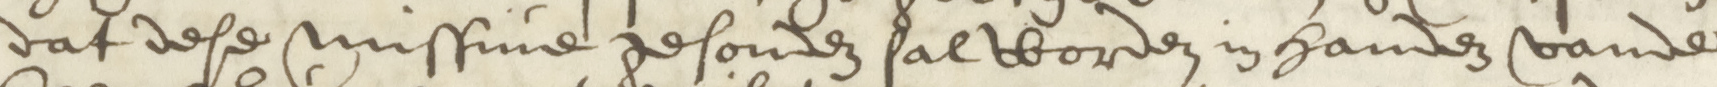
dat dese missive gesonden sal worden in handen vande
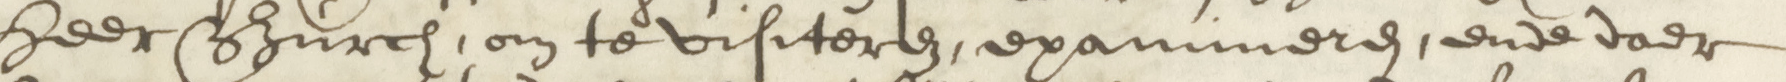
Heer Burch, om te visiteren, examineren, ende daer
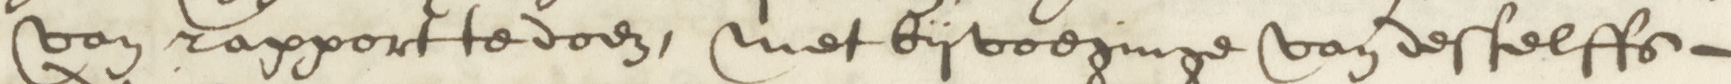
van rapport te doen, met bijvoeginge van desselffs —
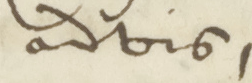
advis.
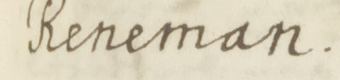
Reneman.
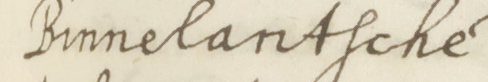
Binnelantsche
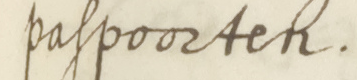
paspoorten.
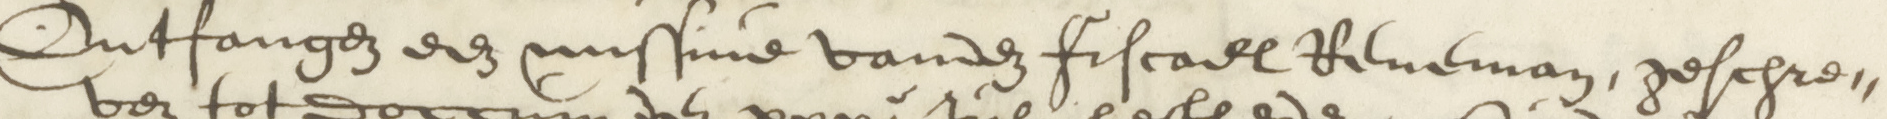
Ontfangen een missive vanden fiscael Reneman, geschre„
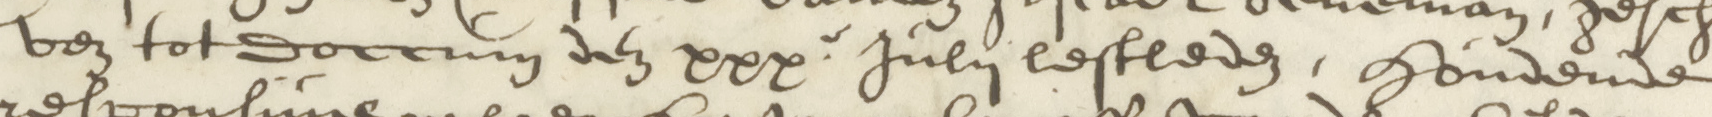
ven tot Doccum den XXXe Julij lestleden, Houdende
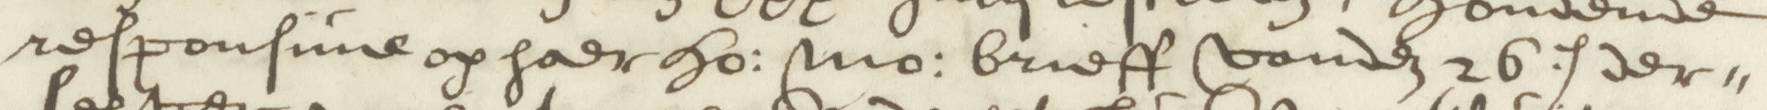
responsive op haer Ho:Mo: brieff vanden 26en der„
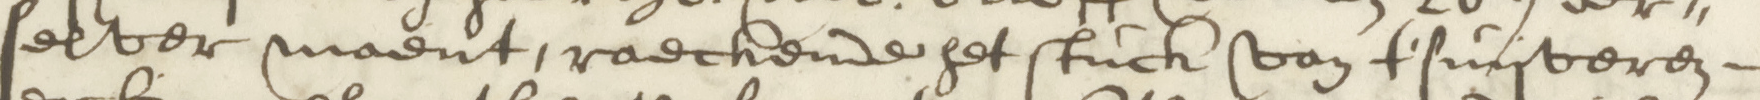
selver maent, raeckende het stuck van t‛suijveren -
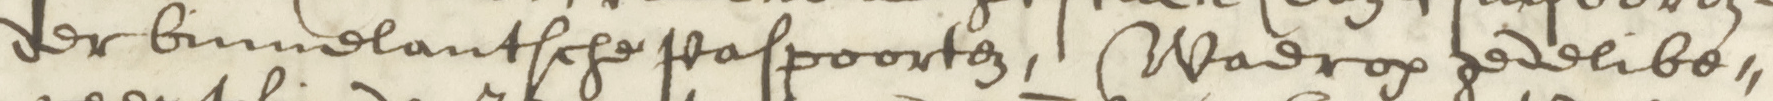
der binnelantsche paspoorten. Waerop gedelibe„
